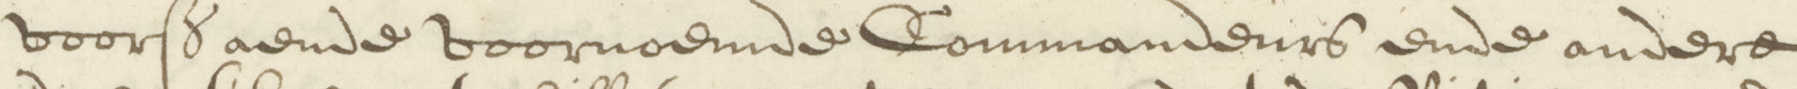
voorsz aende voornoemde Commandeurs ende andere
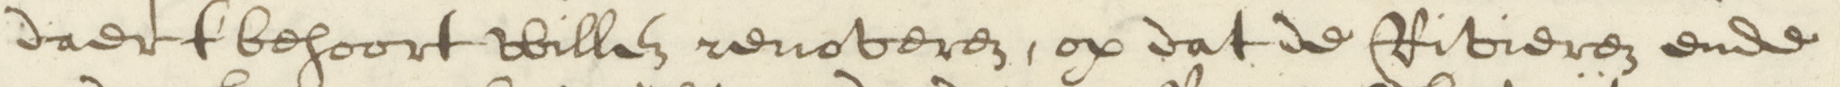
daer t' behoort willen renoveren, op dat de Rivieren ende
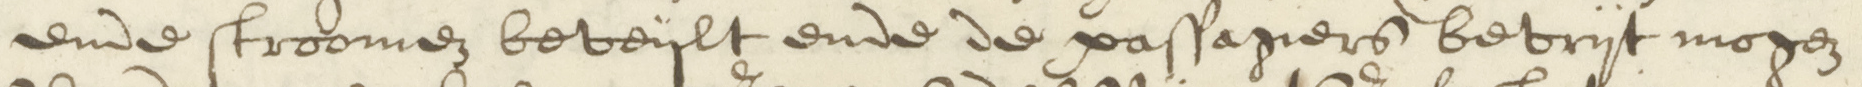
ende stroomen beveijlt ende die passagiers bevrijt mogen
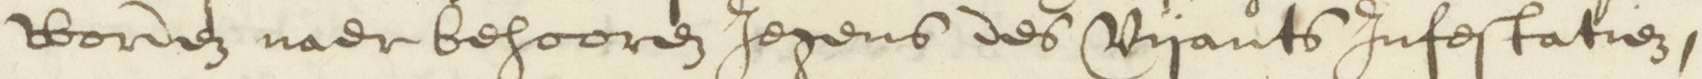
worden naer behooren Jegens des vijants Infestatien.
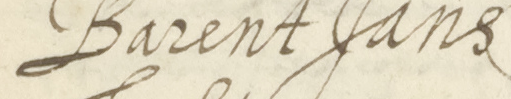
Barent Jans
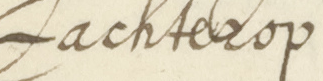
Lachterop
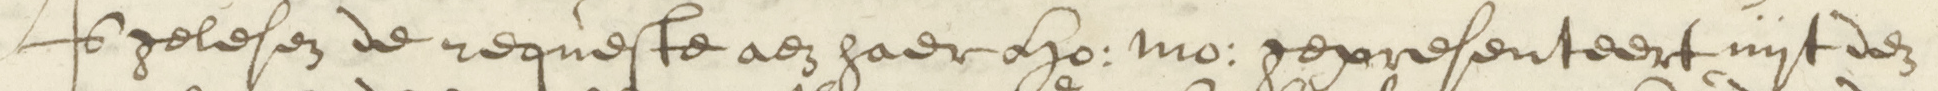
Is gelesen de requeste aen haer Ho:Mo: gepresenteert uijt den
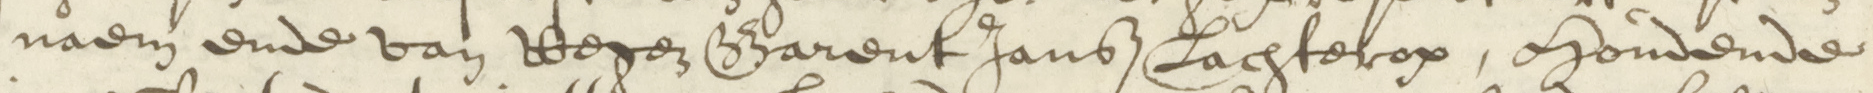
naem ende van Wegen Barent Jansz Lagterop, houdende
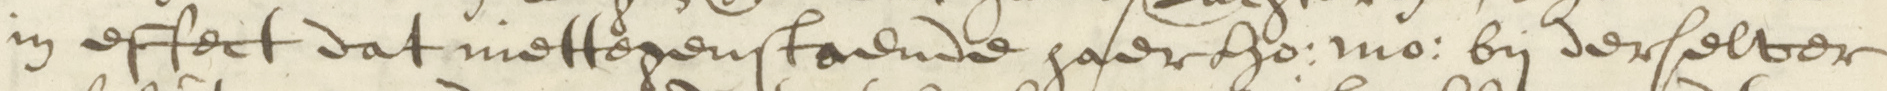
in effect dat niettegenstaende haer Ho:Mo: bij derselver
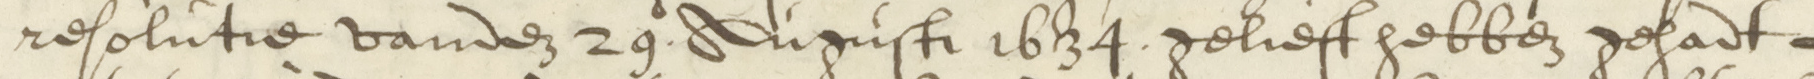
resolutie vanden 29 Augusti 1634 gelieft hebben gehad —
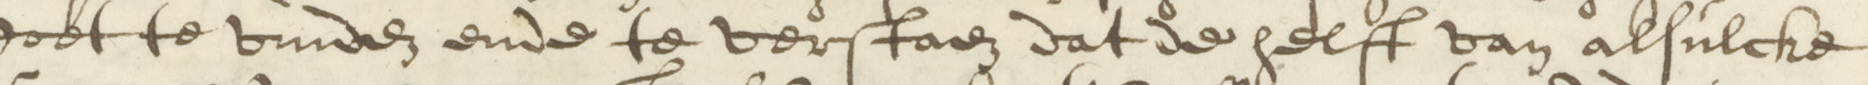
goet te vinden ende te verstaen dat de helft van alsulcke
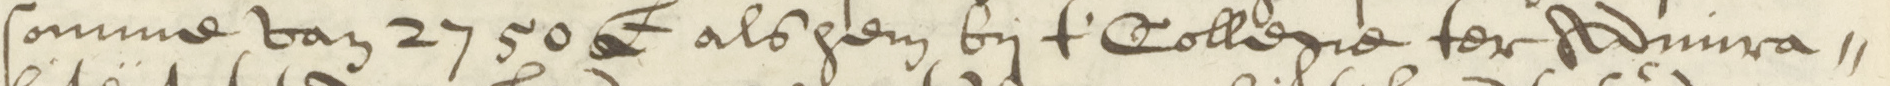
somme van 2750 L als hem bij t'Collegie ter Admira„
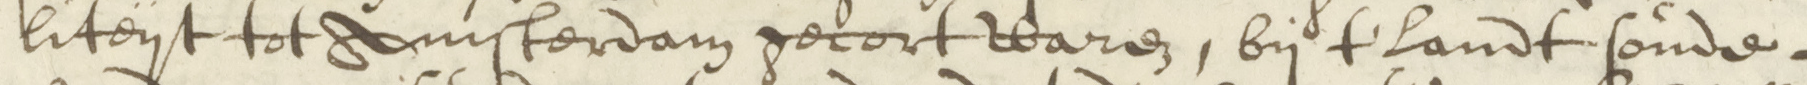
liteijt tot Amsterdam gecort waren, bij t'landt soude —
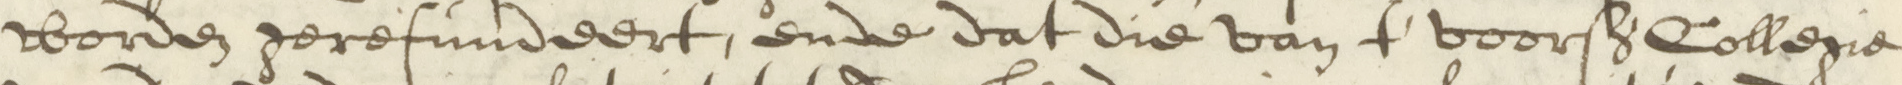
worden gerefundeert, ende dat die van t'voorsz Collegie
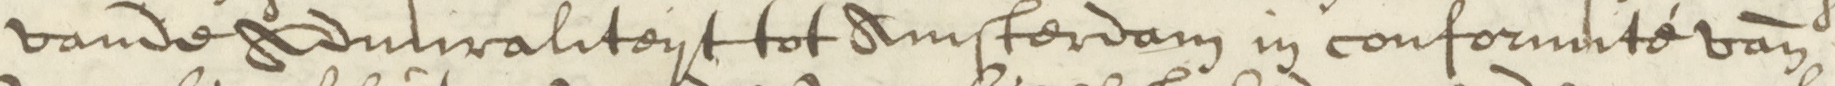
vande Admiraliteijt tot Amsterdam in conformité van
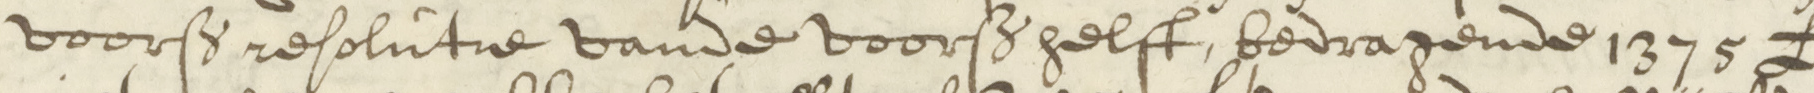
voorsz resolutie vande voorsz helft, bedragende 1375 L,
